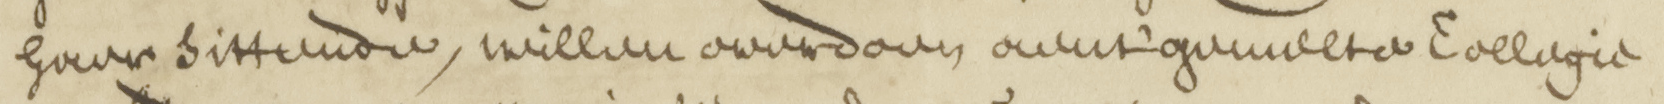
haer sittende, willen overdoen aent' gemelte Collegie
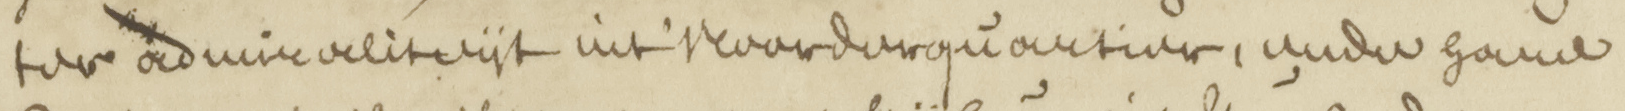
ter admiraliteijt int' Noorderquartier, ende hare
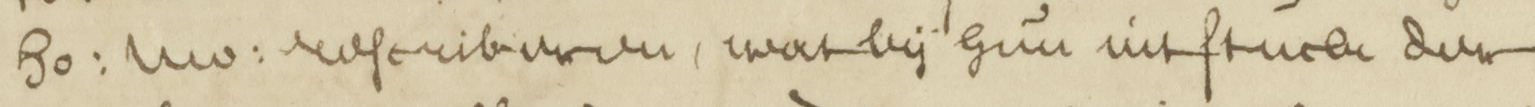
Ho:Mo: rescriberen, wat bij hun int stuck der
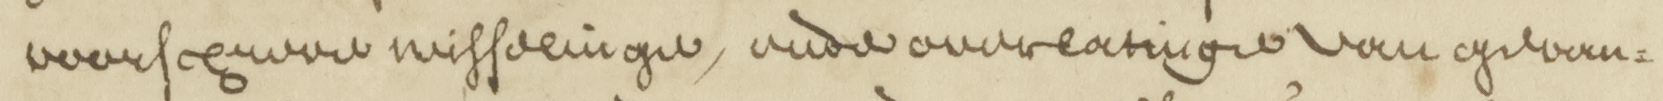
voorschreve wisselinge, ende overlatinge van gevan„
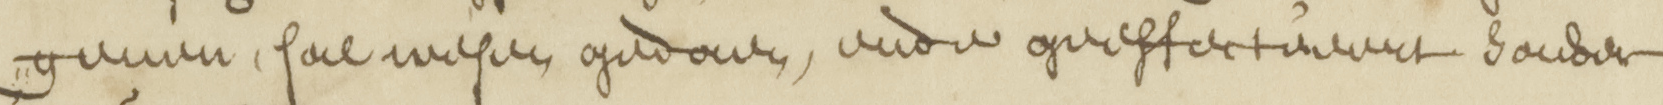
,,genen, sal wesen gedaen, ende geeffectueert sonder
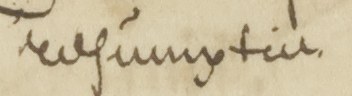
resumptie.
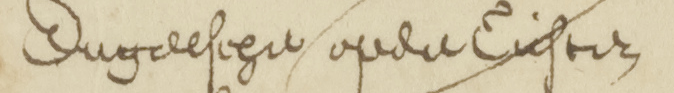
Engelsche opde Custen
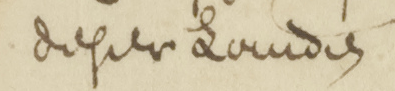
deser Landen
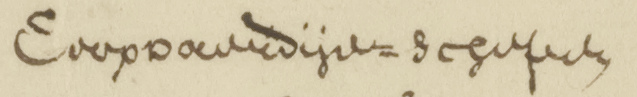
Coopvaerdije schepen
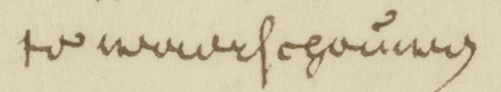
te waerschouwen
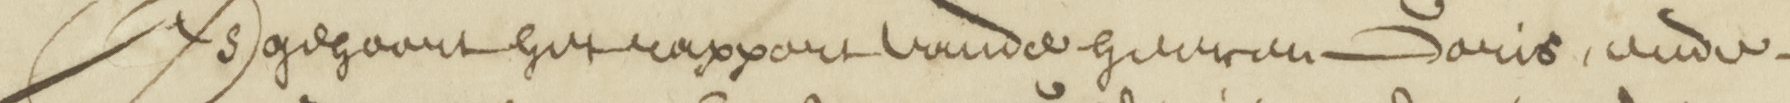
Is gehoort het rapport vande heeren Goris, ende
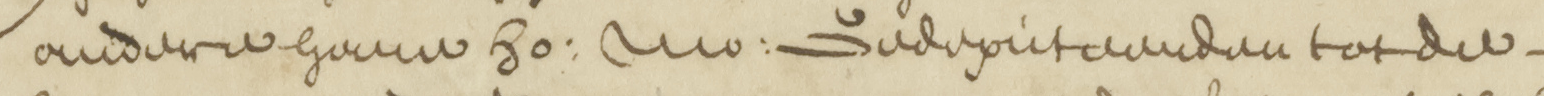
andere hare Ho:Mo: Gedeputeerden tot de
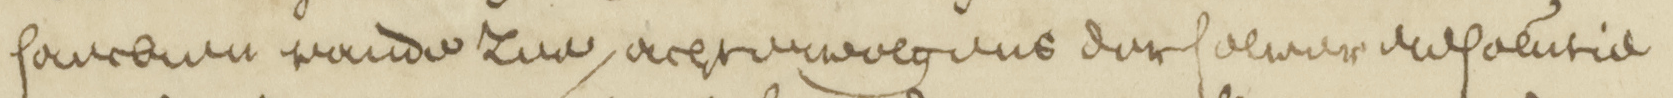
saecken vande Zee, achtervolgens derselver resolutie
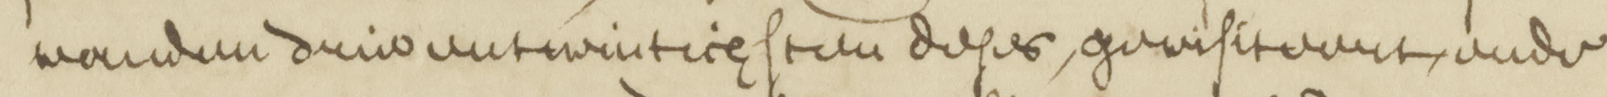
vanden drieentwintichsten deses, gevisiteert ende
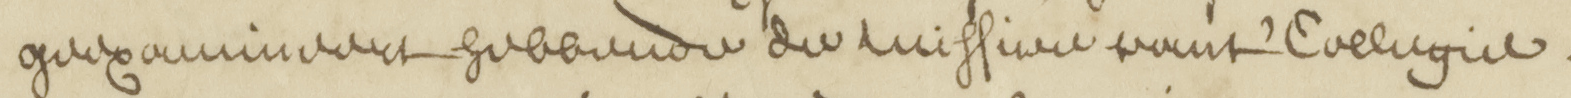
geexamineert hebbende de missive vant' Collegie
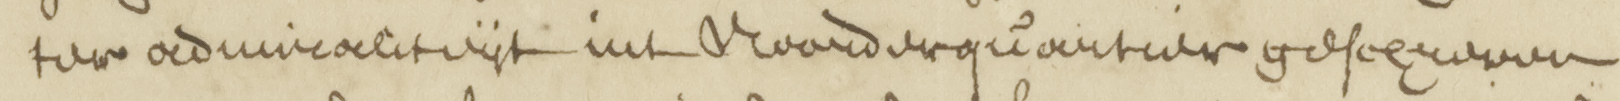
ter admiraliteijt int Noorderquartier geschreven
